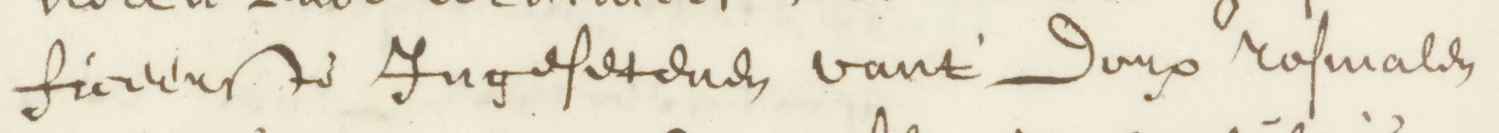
ficeerste Ingesetenen vant‛ Dorp Rosmalen
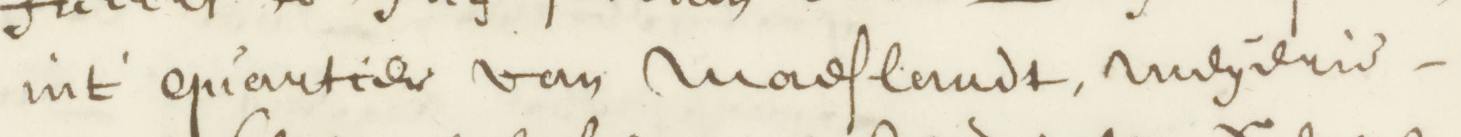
int' quartier van Maeslandt, Meijerie
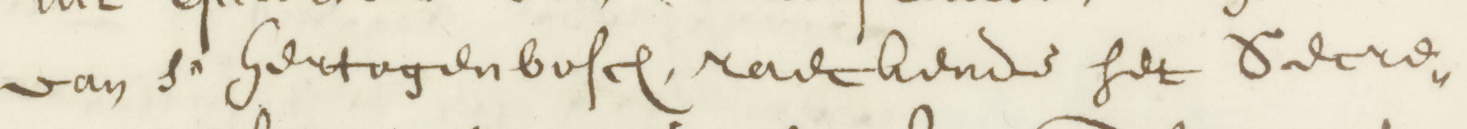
van s' Hertogenbosch, raeckende het Secre„
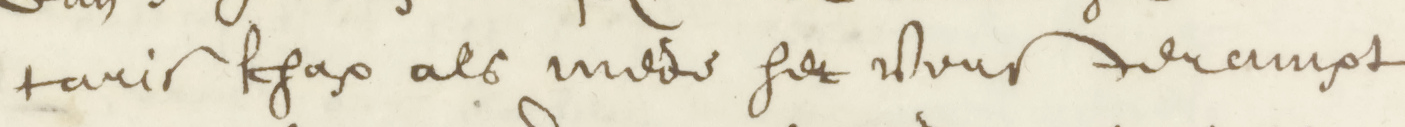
tarisschap als mede het Versterampt
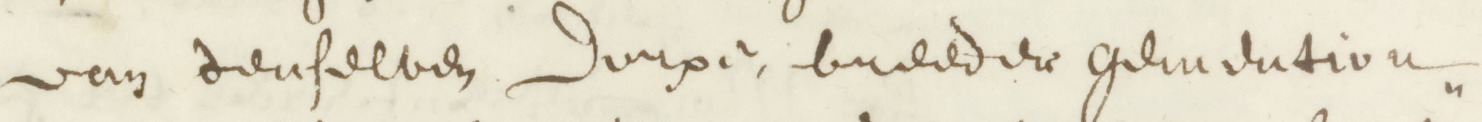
van denselven Dorpe, breeder gemention„
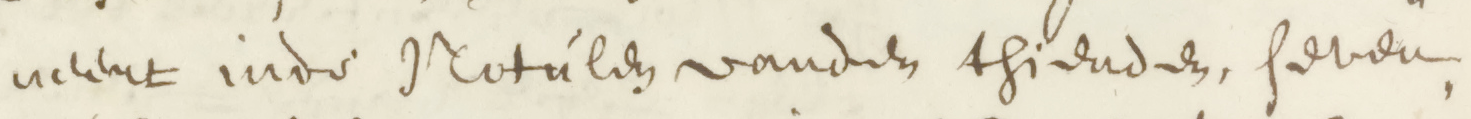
neert inde Notulen vanden thienden, seven
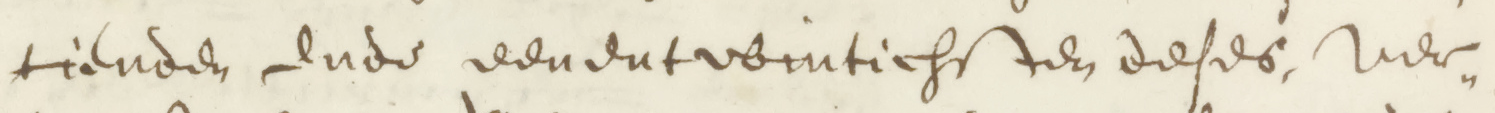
tienden ende eenentwintichsten deses, ver„
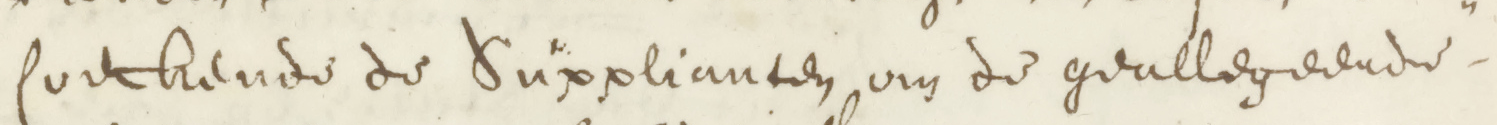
soeckende de Supplianten om de geallegeerde
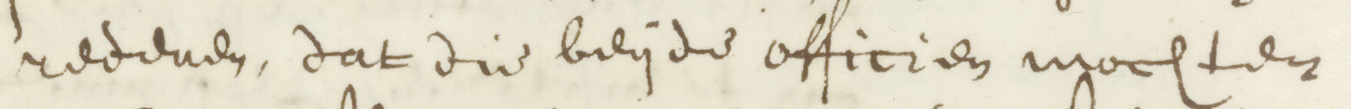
redenen, dat die beijde officien mochten
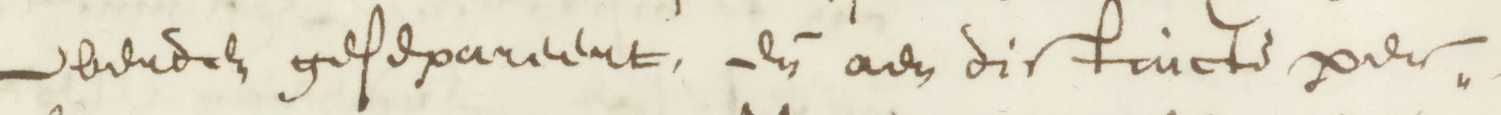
werden gesepareert, en aen distincte per„
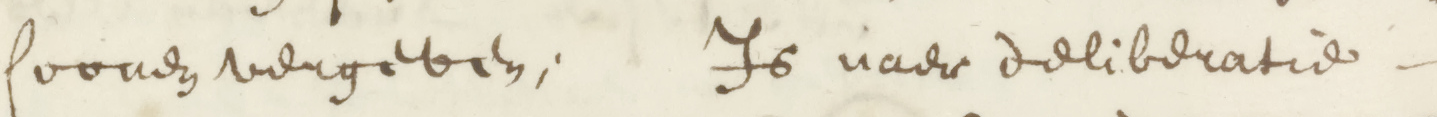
soonen vergeven; Is naer deliberatie
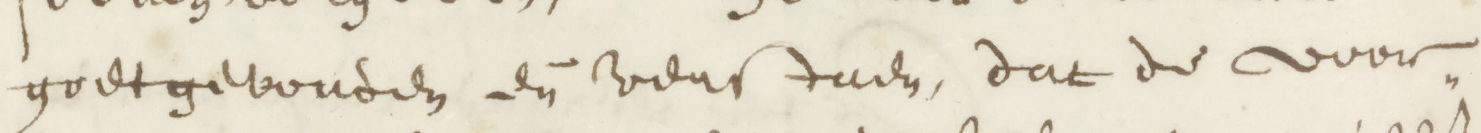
goetgevonden en verstaen, dat de voor„
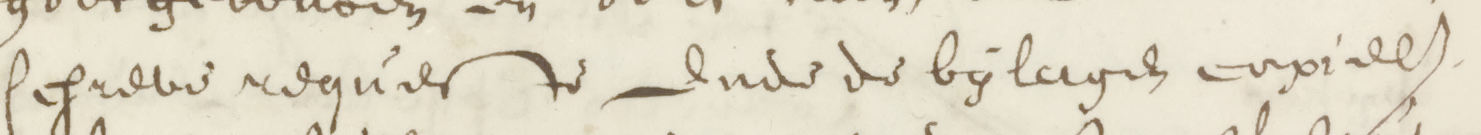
schreve requeste ende de bijlagen copiel
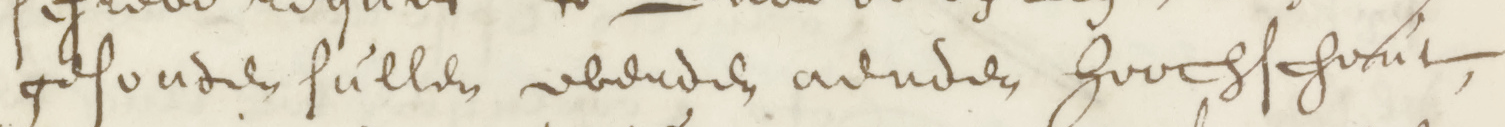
gesonden sullen werden aenden hoochschout,
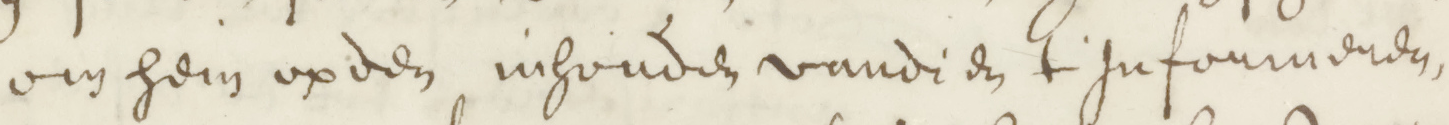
om hem opden inhouden vandien t' informeren,
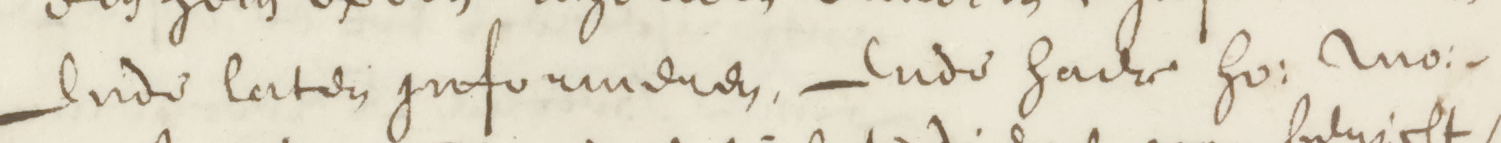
ende laten informeren, ende haer Ho:Mo:
